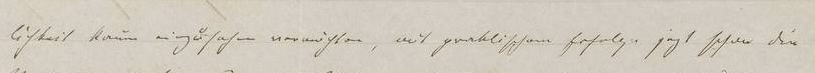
lichkeit kaum einzusehen vermöchten, mit praktischem Erfolge jezt schon die
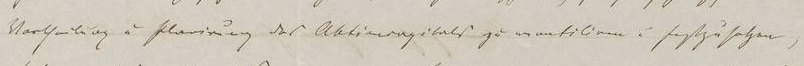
Vertheilung u Placirung des Aktiencapitals zu ventiliren u festzusetzen,
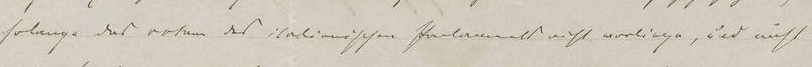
solange das votum des italienischen Parlaments nicht vorliege, und nicht
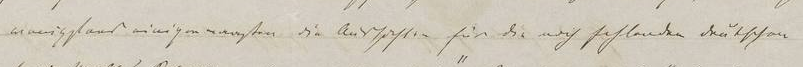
wenigstens einigermaaßen die Aussichten für die noch fehlenden deutschen
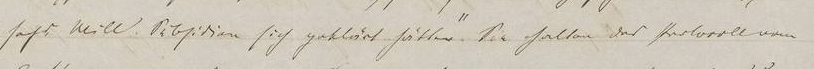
sechs Mill. Subsidien sich geklärt hätten». Sie halten das Protocoll vom
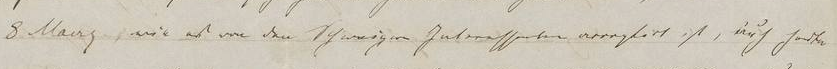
8 Maerz, wie es von den Schweizer Interessenten acceptirt ist, auch heute
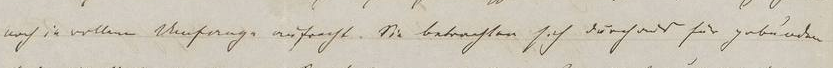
noch in vollem Umfange aufrecht. Sie betrachten sich durchaus für gebunden
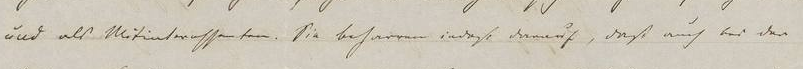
und als Mitinteressenten. Sie beharren indeß darauf, daß auch bei der
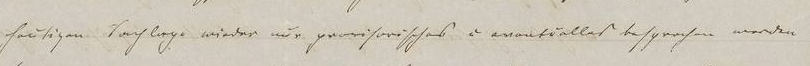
heutigen Sachlage wieder nur provisorisches u eventuelles besprochen werden
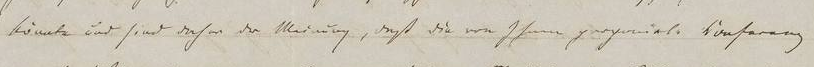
könnte und sind daher der Meinung, daß die von Ihnen proponirte Conferenz
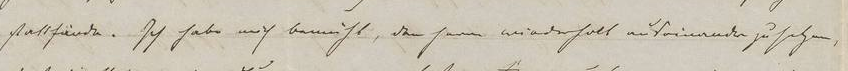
stattfände. Ich habe mich bemüht, den Herren wiederholt auseinander zu setzen,
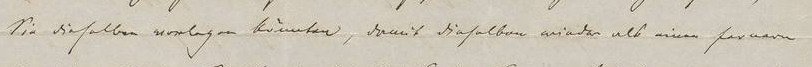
Sie dieselben vorlegen könnten, damit dieselben wieder als einen fernern
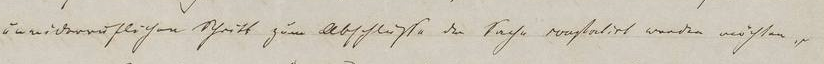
unwiderruflichen Schritt zum Abschluße der Sache constatirt werden möchten,
